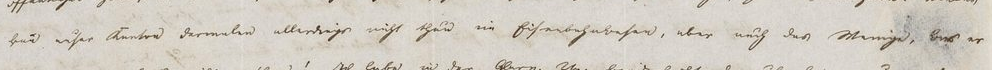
kann unser Kanton dermalen allerdings nicht thun im Eisenbahnwesen, aber auch das Wenige, was er
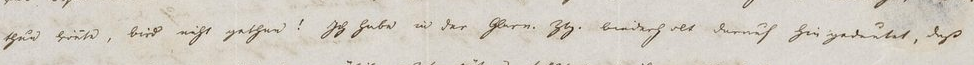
thun könnte, wird nicht gethan! Ich habe in der Glarn. Ztg. wiederholt darauf hingedeutet, daß
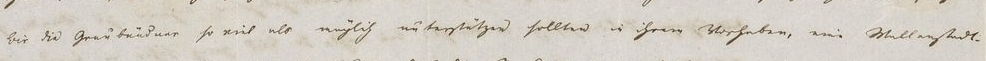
wir die Graubündner so viel als möglich unterstützen sollten in ihrem Vorhaben, eine Wallenstadt-
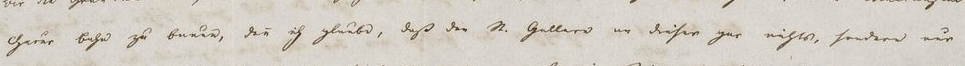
Churer Bahn zu bauen, denn ich glaube, daß den St. Gallern an dieser gar nichts, sondern nur
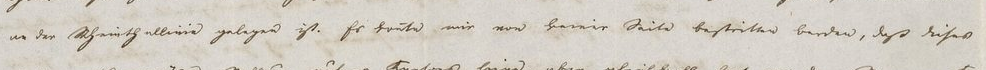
an der Rheinthallinie gelegen ist. Es konnte mir von keiner Seite bestritten werden, daß dieses
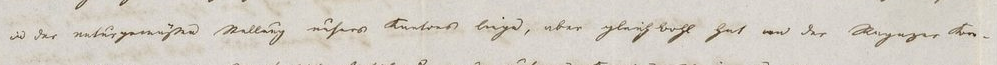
in der naturgemäßen Stellung unsers Kantons liege, aber gleichwohl hat an der Ragazer Kon-
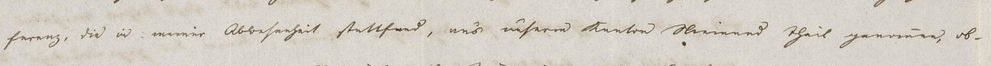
ferenz, die in meiner Abwesenheit stattfand, aus unserm Kanton Niemand Theil genommen, ob-
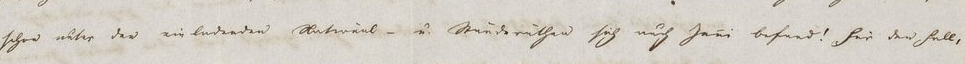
schon unter den einladenden National- u. Ständeräthe sich auch Jenni befand! Für den Fall,
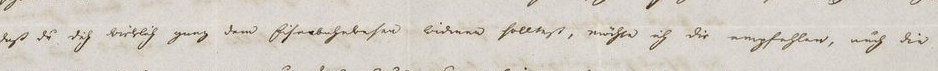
daß Du Dich wirklich ganz dem Eisenbahnwesen widmen solltest, möchte ich Dir empfehlen, auch die
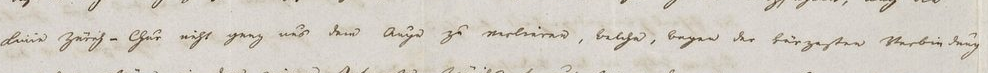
Linie Zürich–Chur nicht ganz aus dem Auge zu verlieren, welche, wegen der kürzesten Verbindung
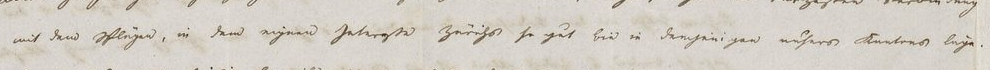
mit dem Splügen, in dem eignen Intereße Zürichs so gut wie in demjenigen unsers Kantons läge.
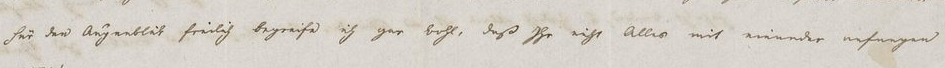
Für den Augenblick freilich begreife ich gar wohl, daß Ihr nicht Alles mit einander anfangen
